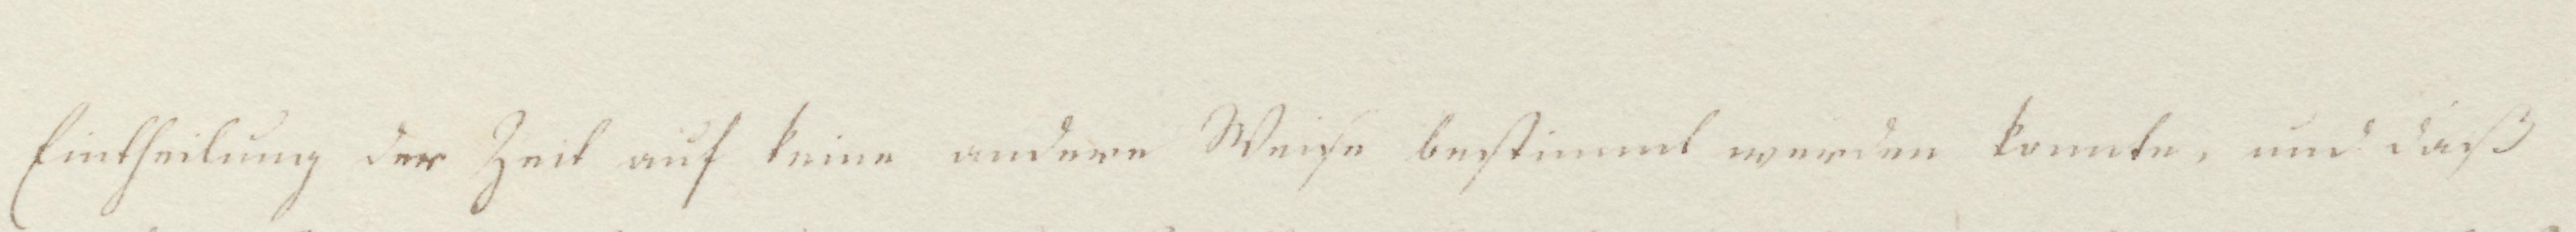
Eintheilung der Zeit auf keine andere Weise bestimmt werden konnte, und daß
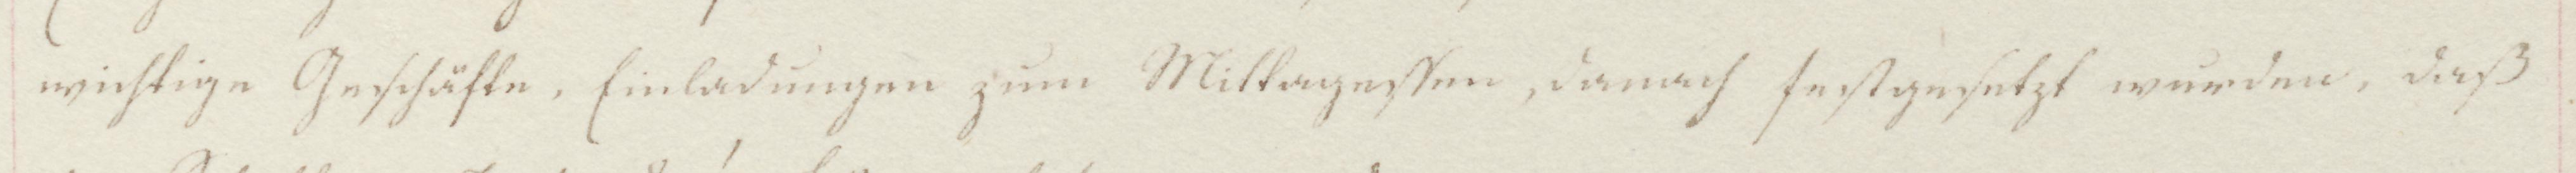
wichtige Geschäfte, Einladungen zum Mittagessen, danach festgesetzt wurden, daß
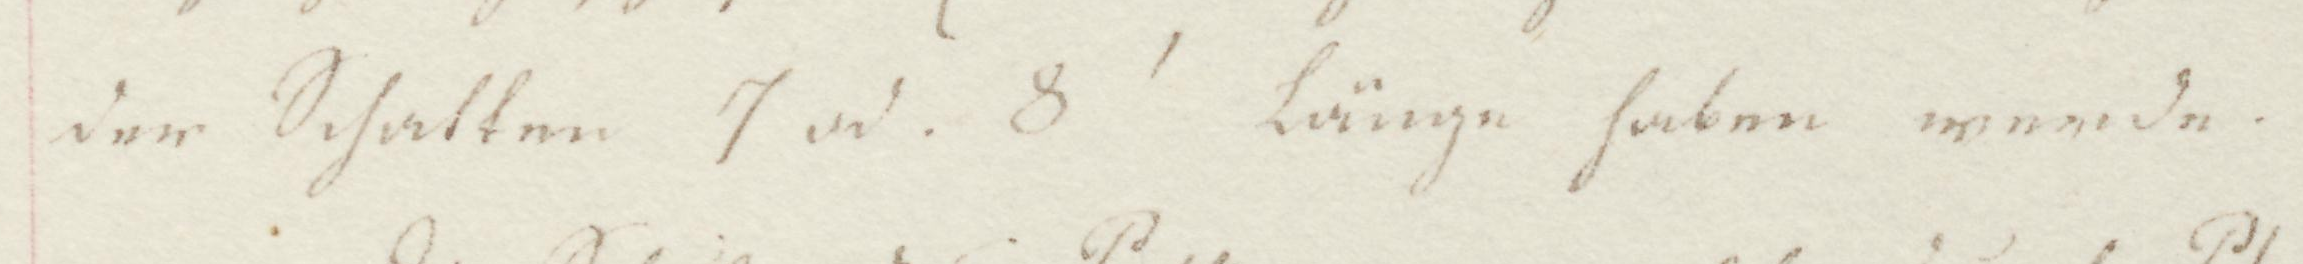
der Schatten 7 od. 8′ Länge haben werde.
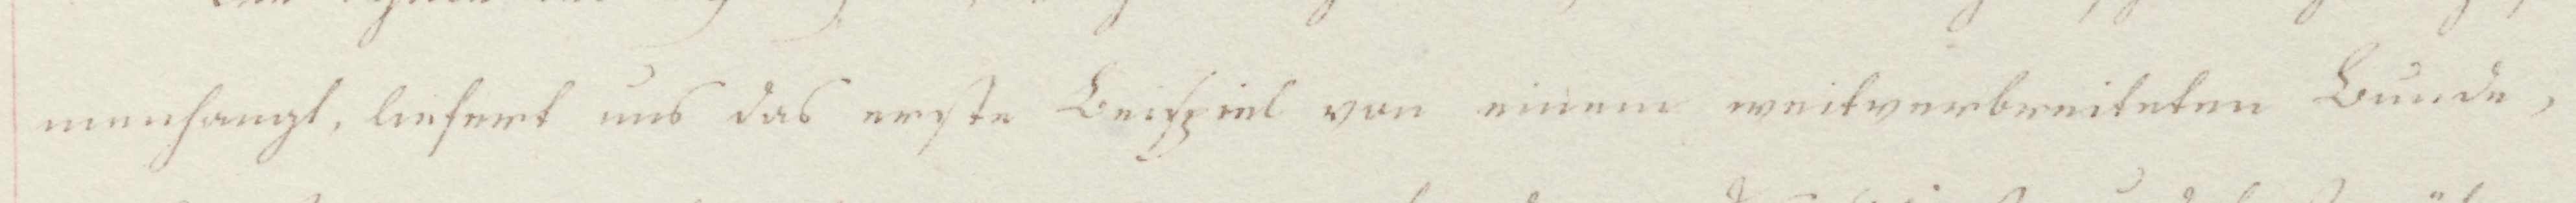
menhangt, liefert uns das erste Beispiel von einem weitverbreiteten Bunde,
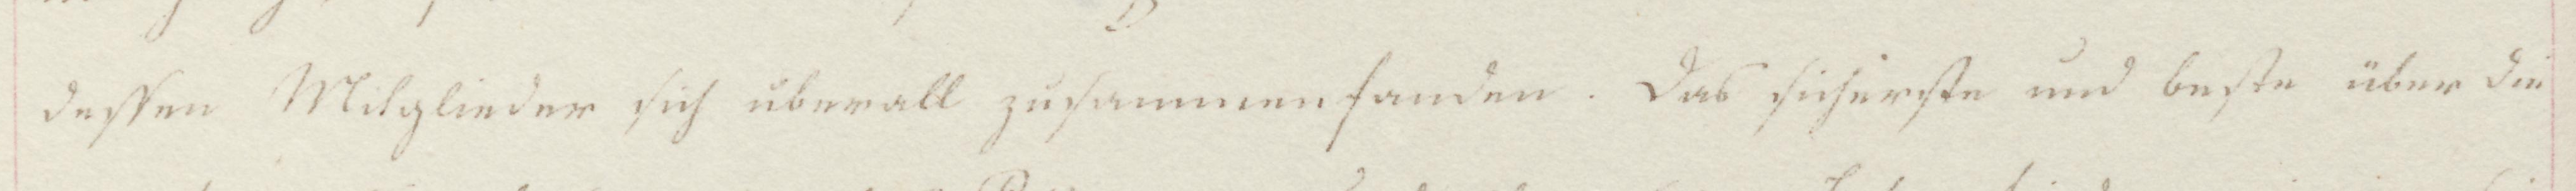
dessen Mitglieder sich überall zusammenfanden. Das sicherste und beste über die
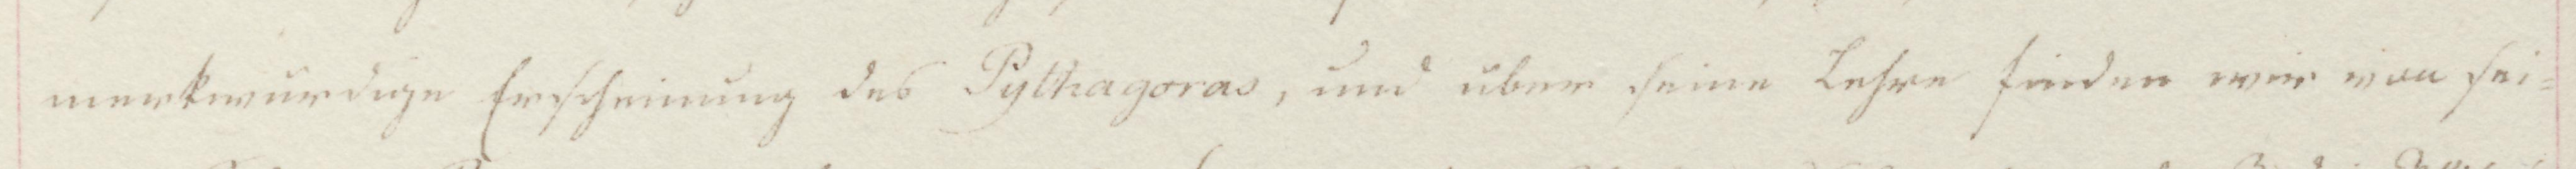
merkwürdige Erscheinung des Pythagoras, und über seine Lehre finden wir von sei-
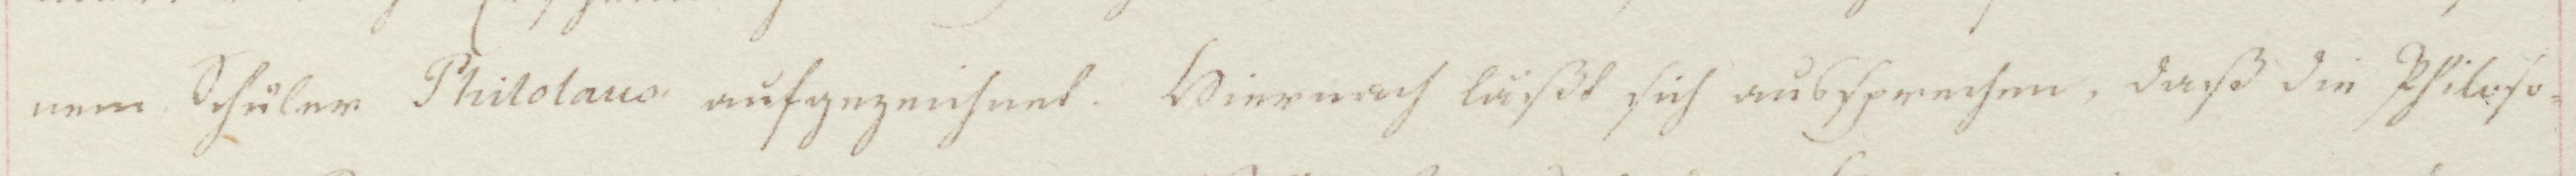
nem Schüler Philolaus aufgezeichnet. Hiernach läßt sich aussprechen, daß die Philoso-
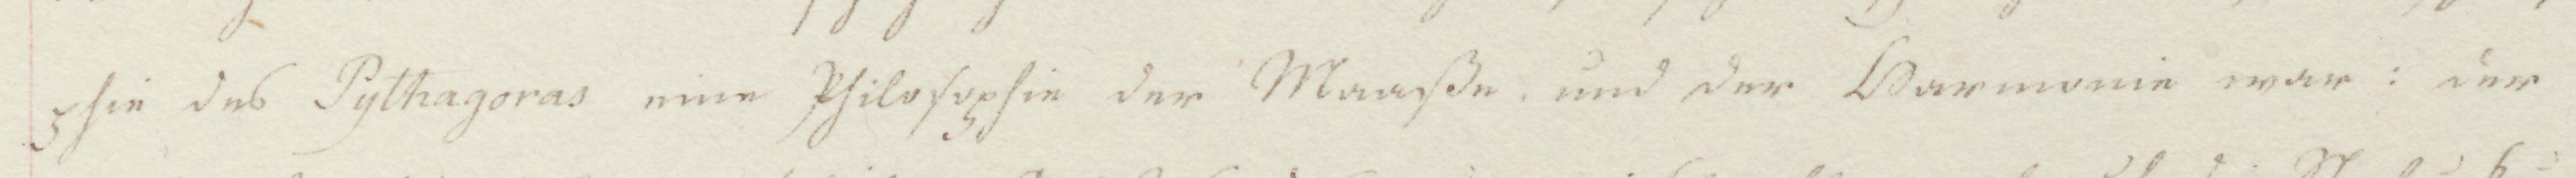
phie des Pythagoras eine Philosophie der Maaße, und der Harmonie war: der
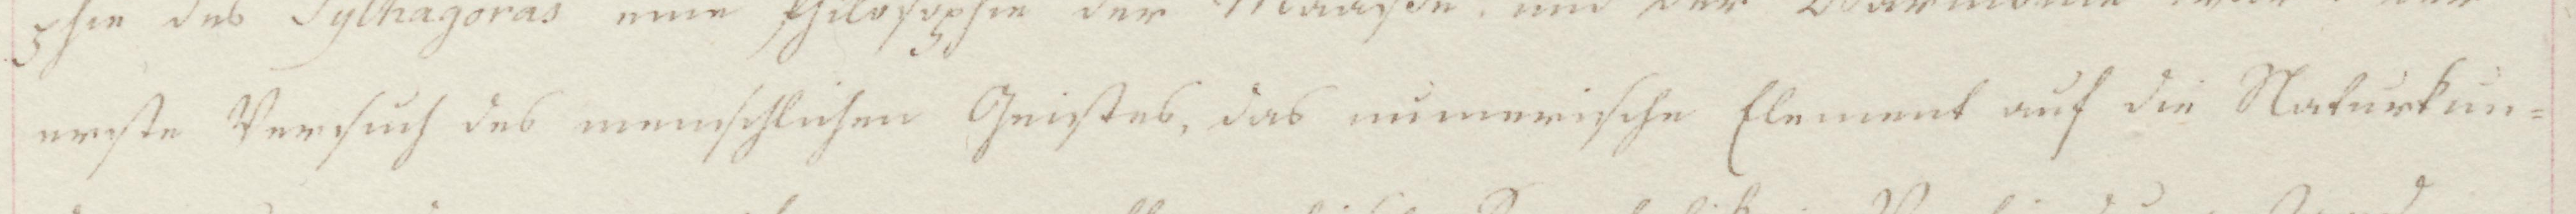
erste Versuch des menschlichen Geistes, das numerische Element auf die Naturkun-
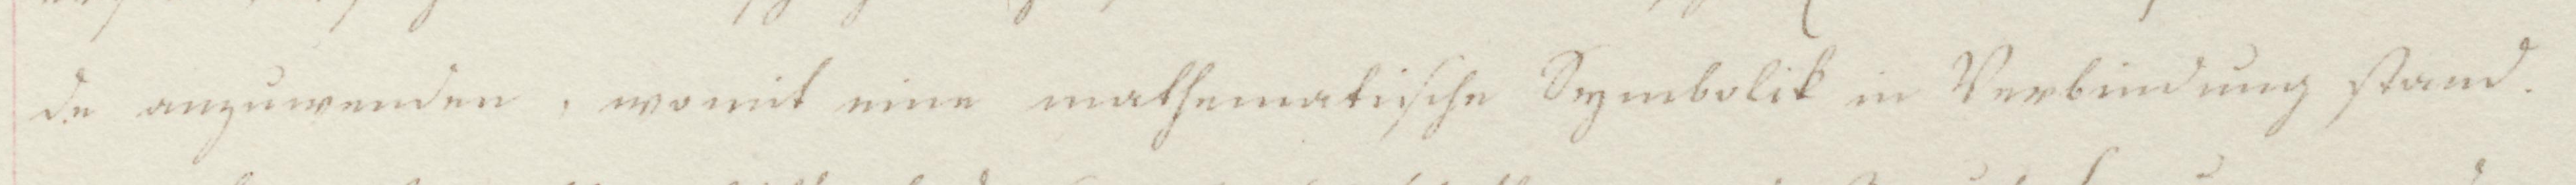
de anzuwenden, womit eine mathematische Symbolik in Verbindung stand.
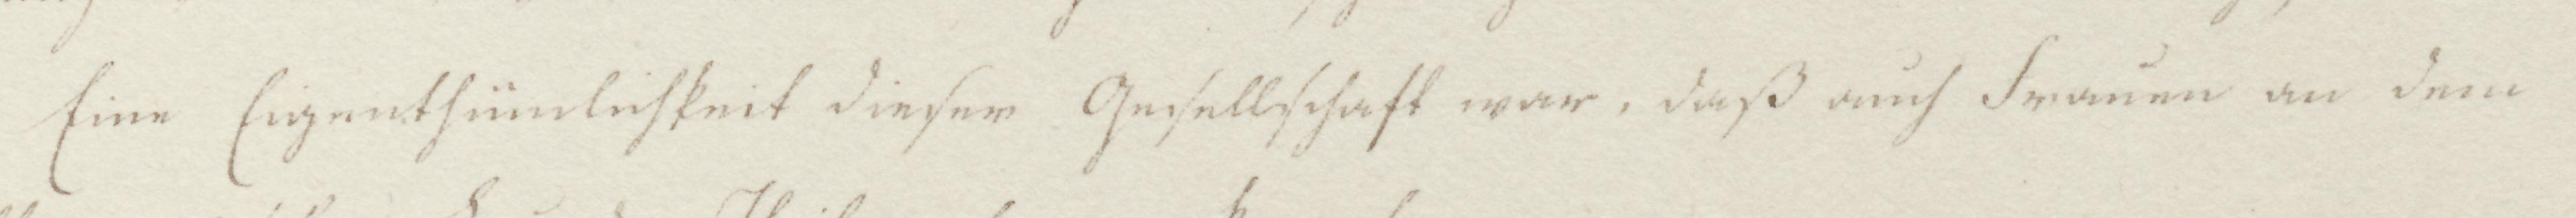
Eine Eigenthümlichkeit dieser Gesellschaft war, daß auch Frauen an dem
